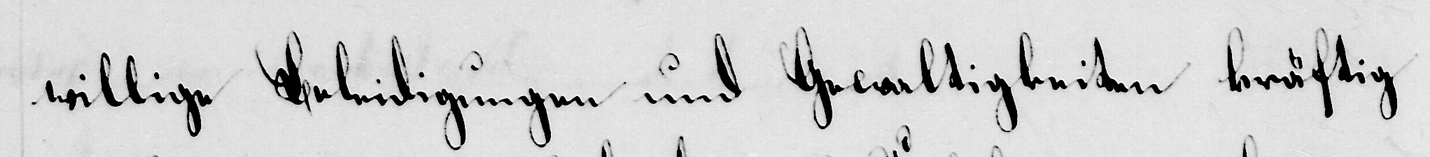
willige Beleidigungen und Gewaltigkeiten kräftig
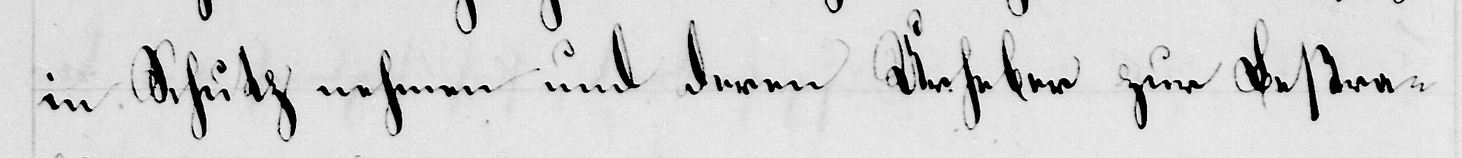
in Schutz nehmen und deren Urheber zur Bestra¬
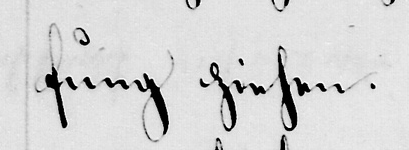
fung ziehen.
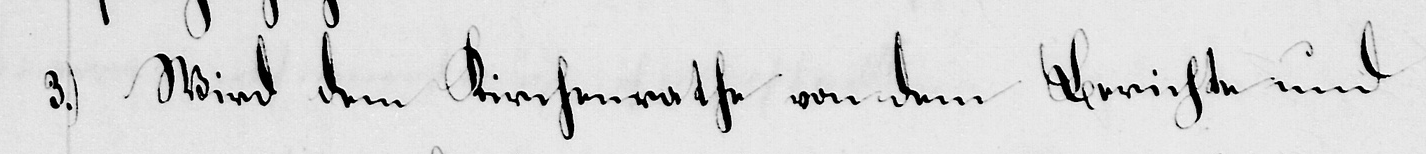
3.) Wird dem Kirchenrathe von dem Berichte und
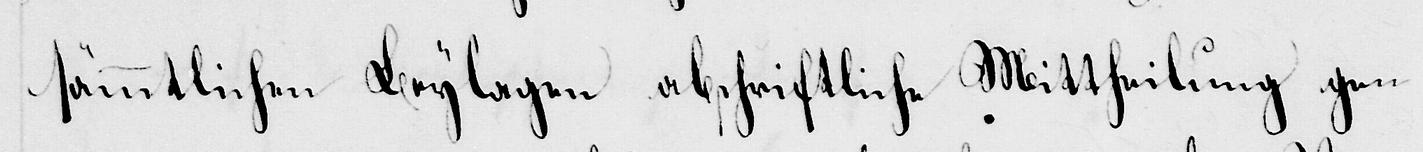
sämmtlichen Beylagen abschriftliche Mittheilung ge¬
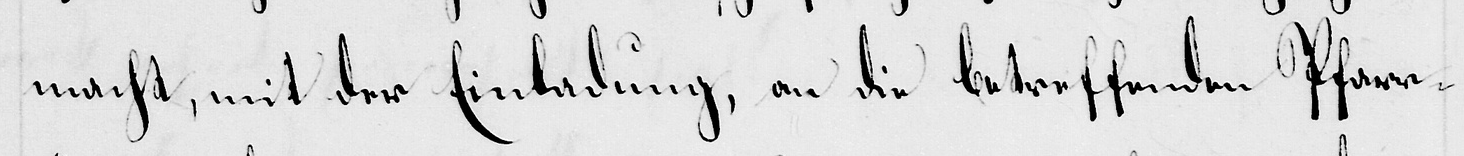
macht, mit der Einladung, an die betreffenden Pfarr¬
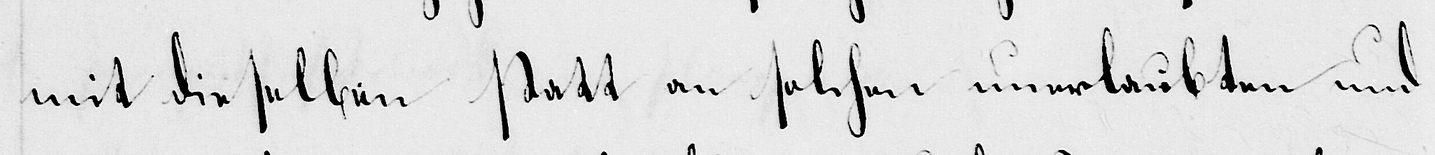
mit dieselben statt an solchen unerlaubten und
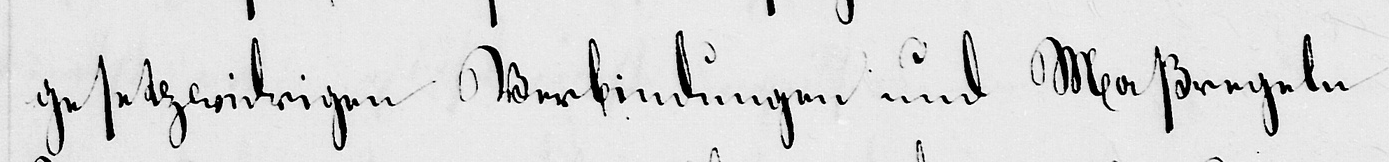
gesetzwidrigen Verbindungen und Maßregeln
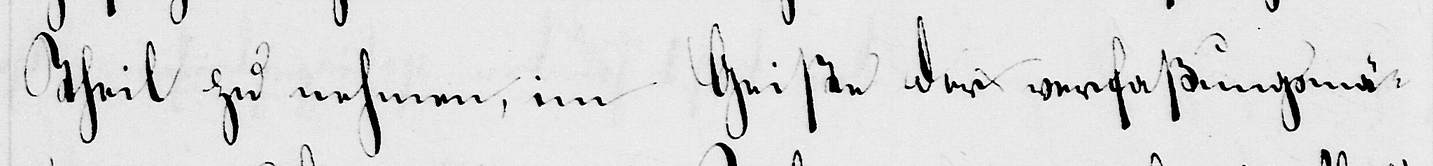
Theil zu nehmen, im Geiste der verfaßungsmä¬
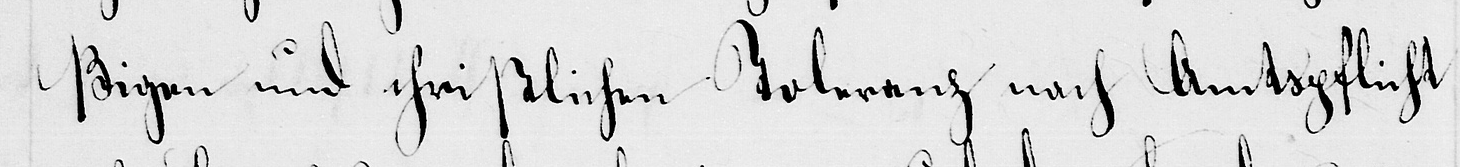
ßigen und christlichen Toleranz nach Amtspflicht
